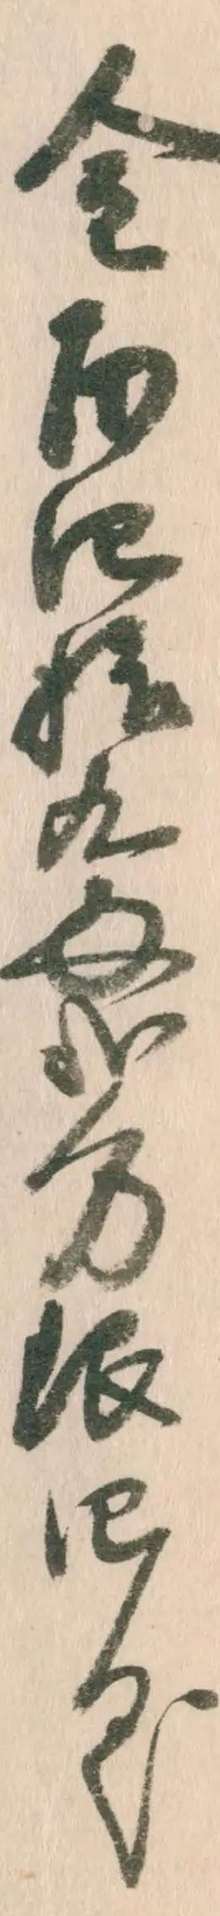金百四拾九両弐分銀四匁
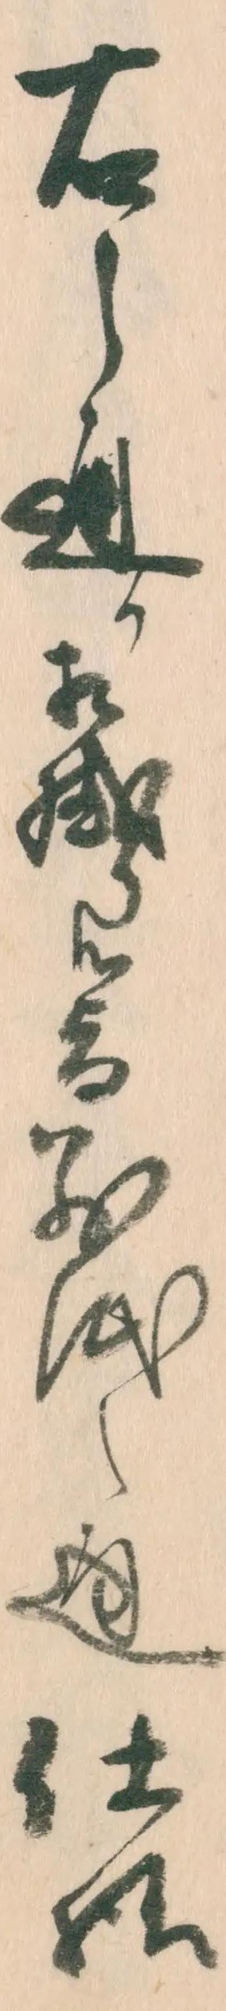右之通り相掛り候旨別紙之通仕様

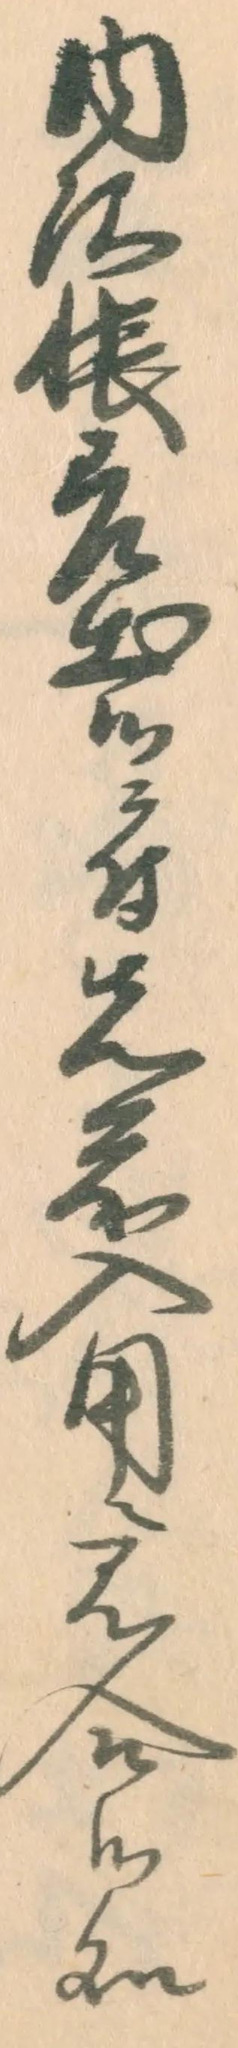内訳帳差出候に付先前入用に見合候処
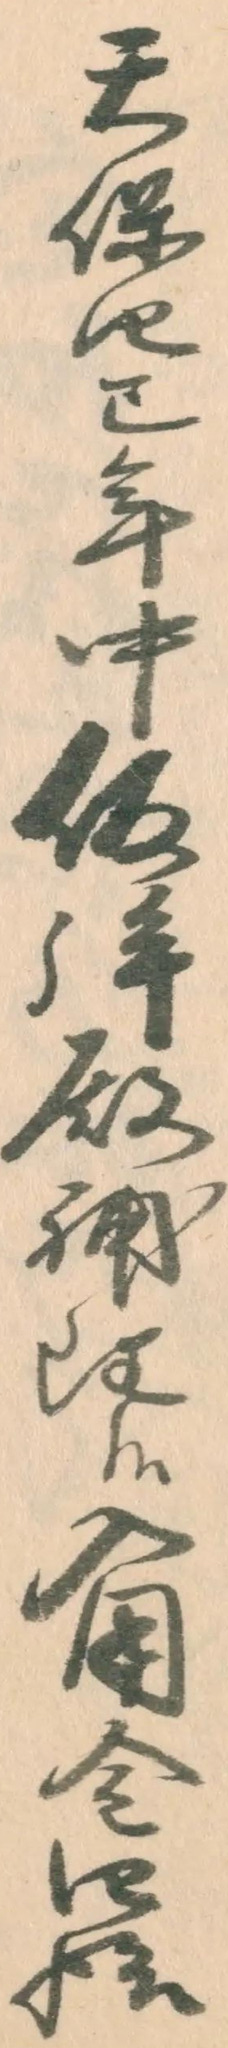天保四巳年中仮拝殿補理候入用金四拾
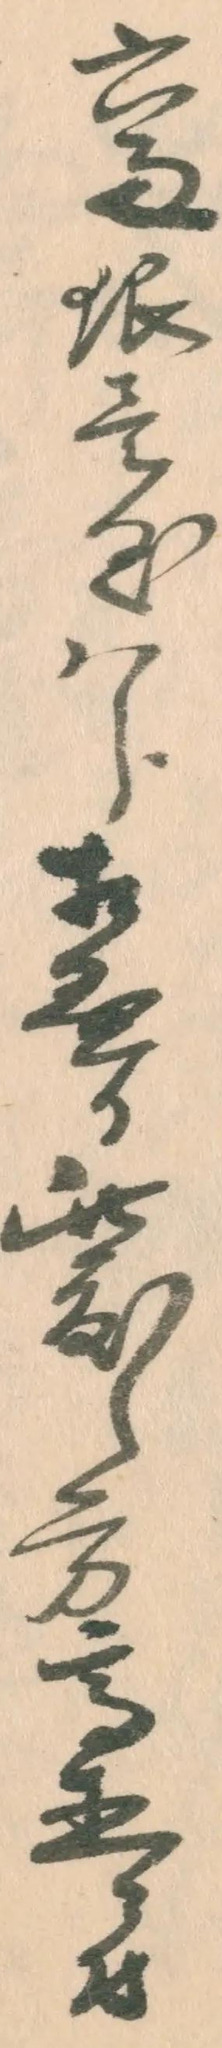六両銀壱匁八分相懸り此度之方高直に付
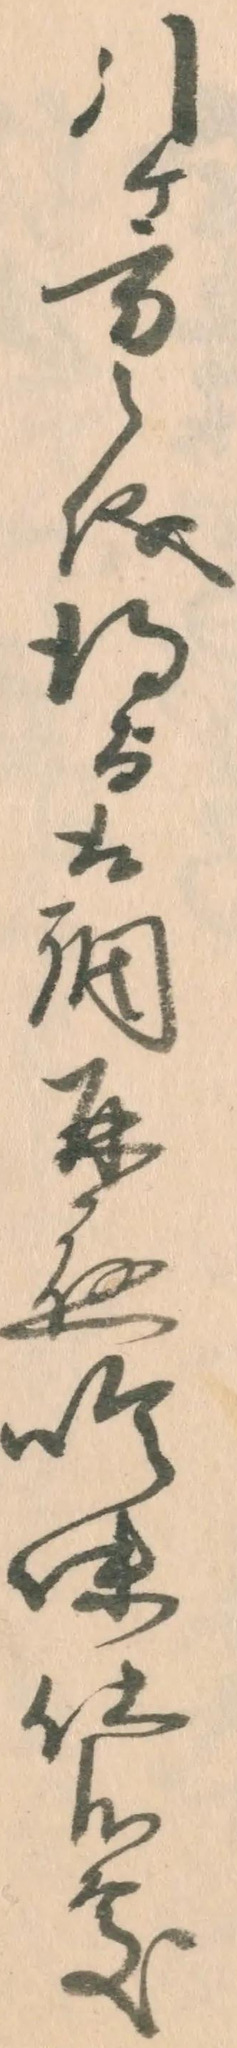引ヶ方之儀得と取調再応吟味仕候処
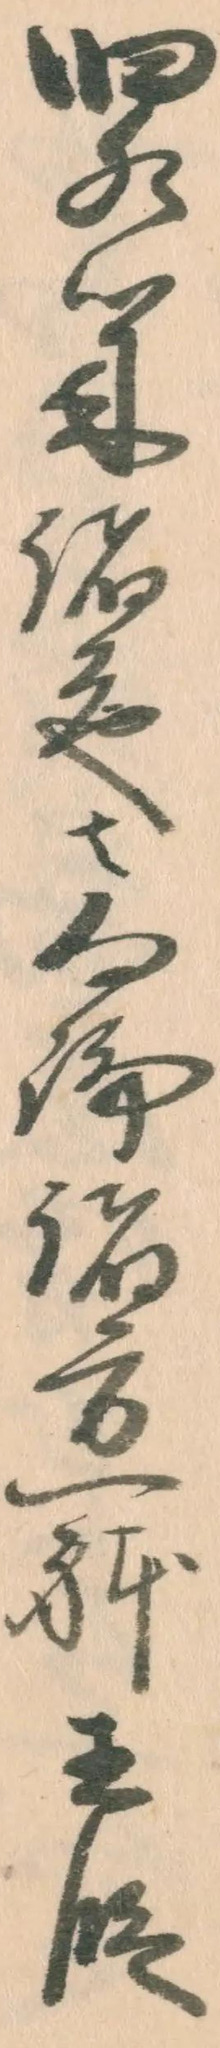旧冬以来諸色は勿論諸方一体直段
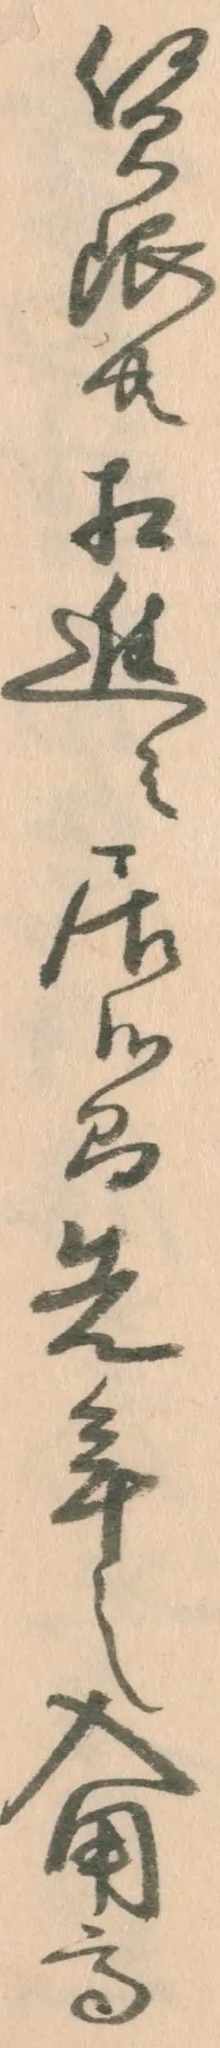賃銀共相進み居候間先年之入用高
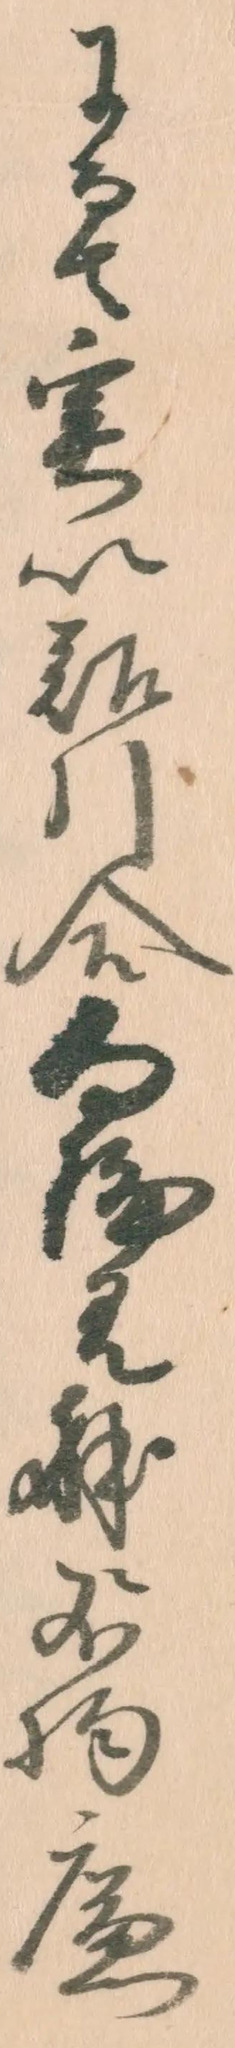に而は実以難引合勿論見体に不拘廉
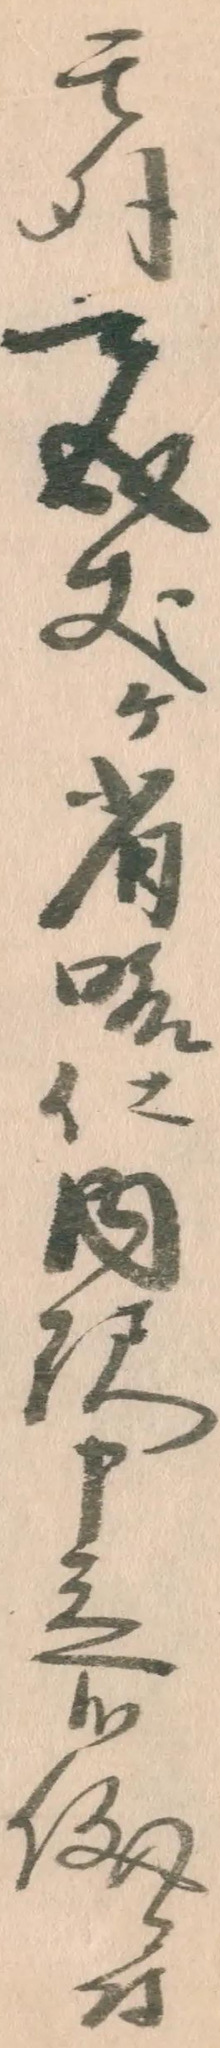其外可成丈ヶ省略仕内訳申立候儀に付
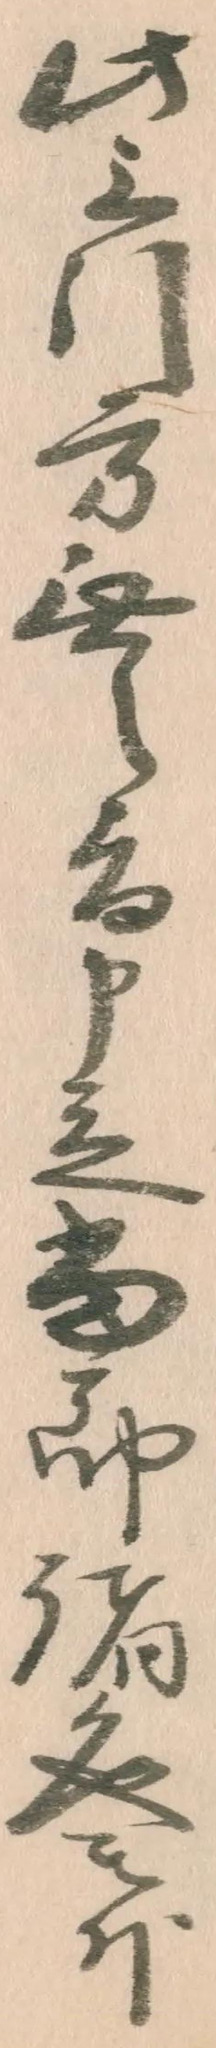此上引方無之旨申立当節諸色其外
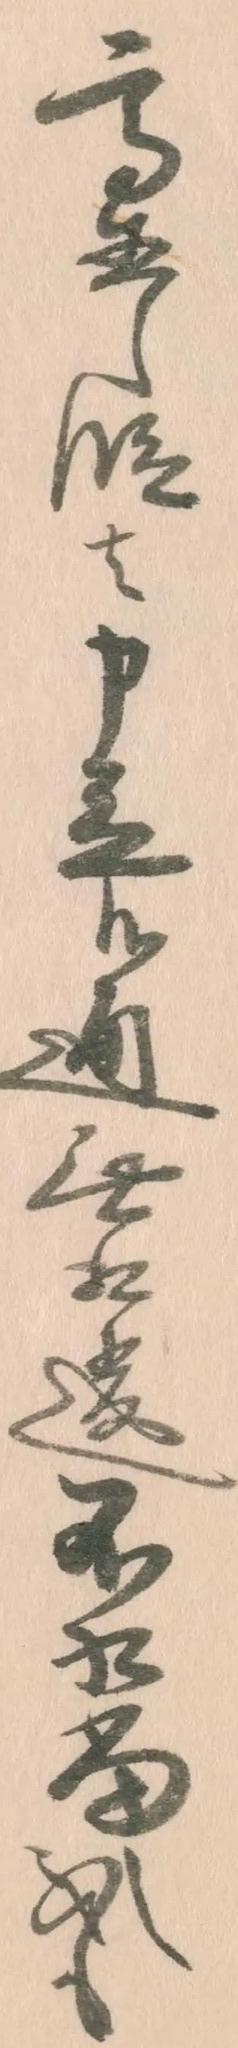高直之段は申立候通無相違不相当之義も
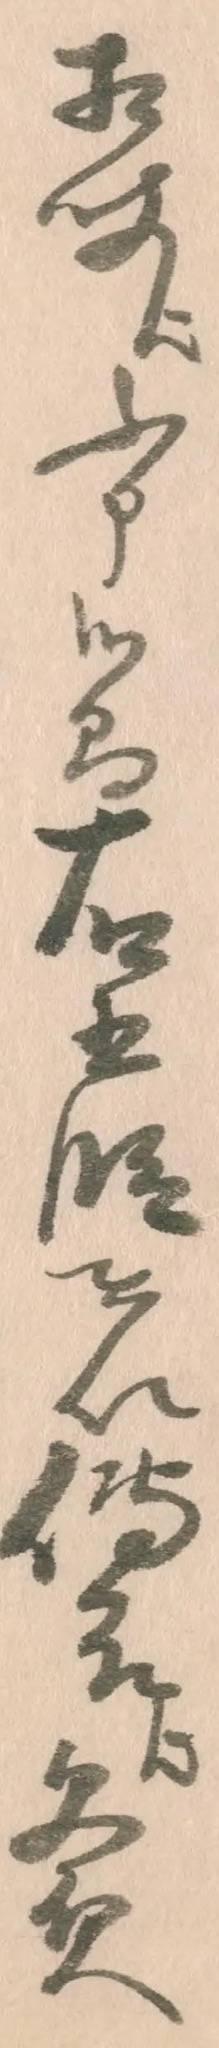相聞え不申候間右直段を以伝吉え受負
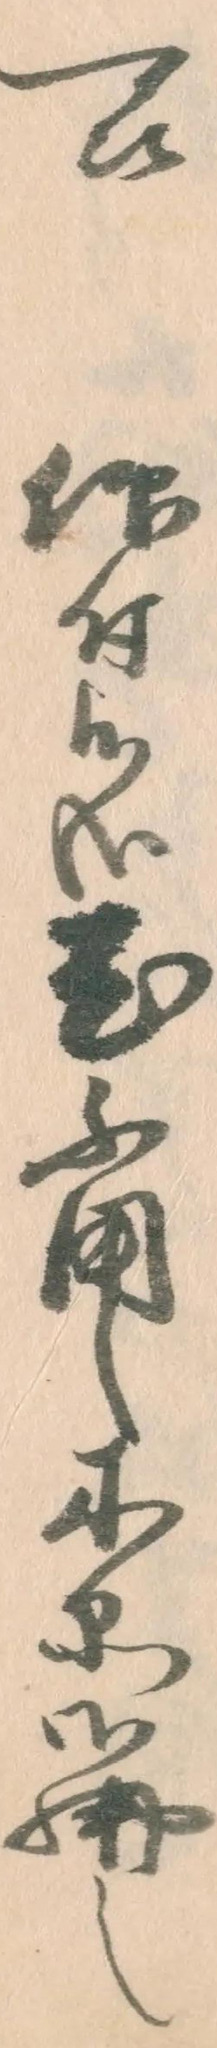可被仰付候哉尤不用之木品御払之

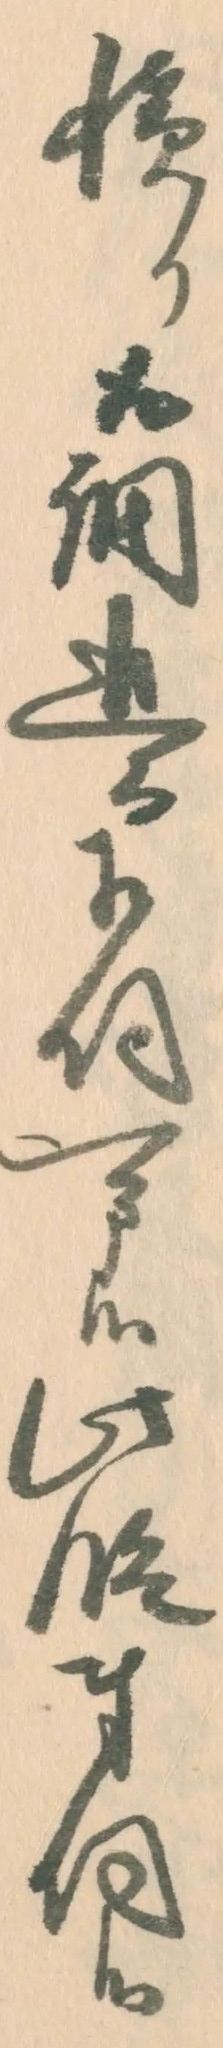積り取調追而相伺可申候此段奉伺候
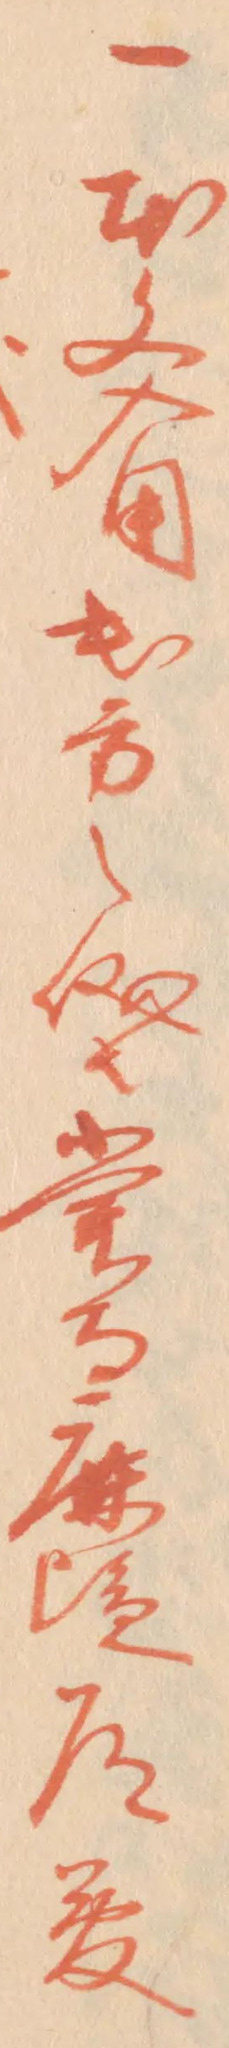「一本文入用出方之儀は堂守鹿塩道菅
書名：三十三間堂. [1]
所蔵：国立国会図書館 National Diet Library, JAPAN
